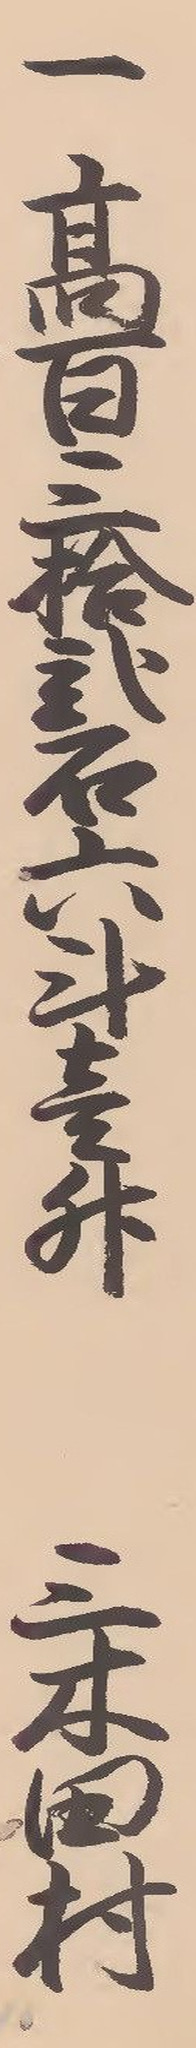一高百三拾弐石六斗壱升三木田村

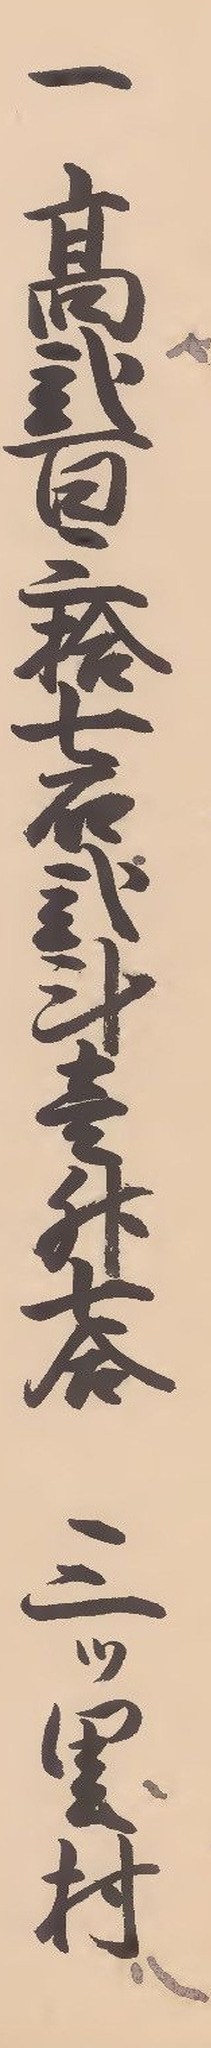一高弐百三拾七石弐斗壱升七合三ッ里村
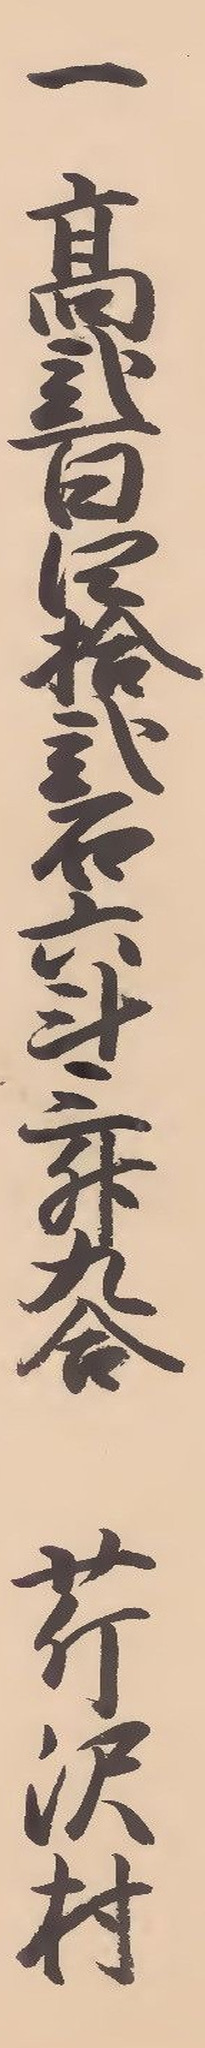一高弐百四拾弐石六斗三升九合芹沢村
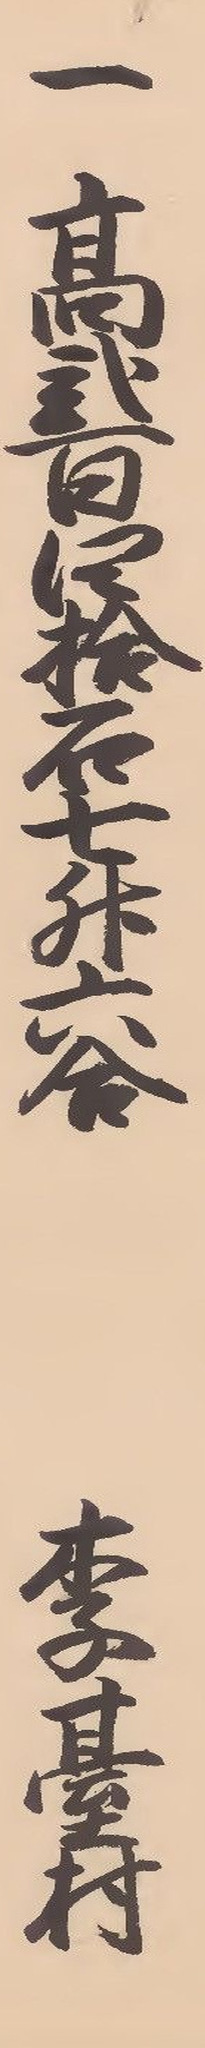一高弐百四拾石七升六合李台村
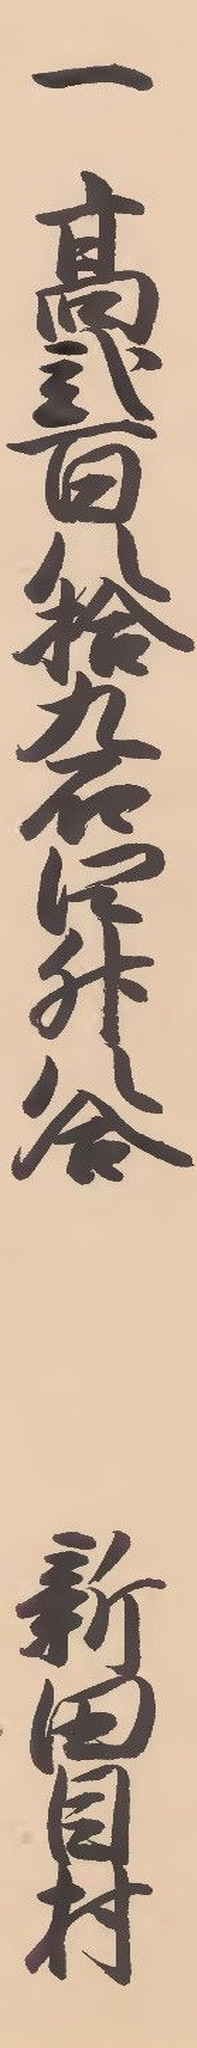一高弐百八拾九石四升八合新田目村
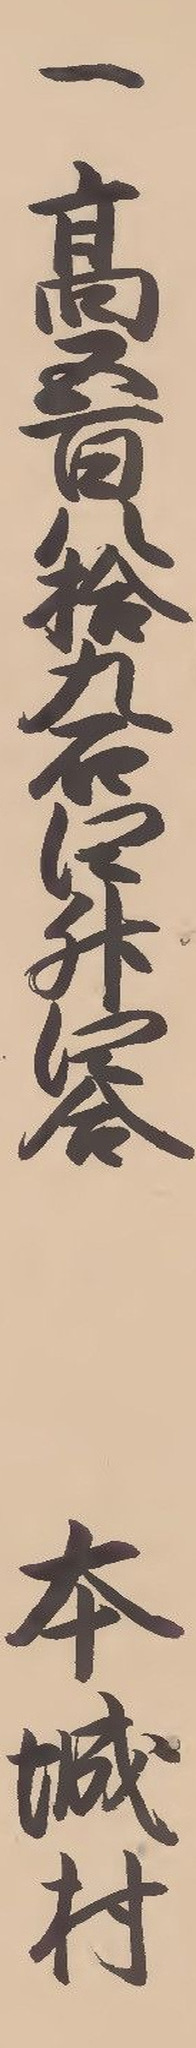一高五百八拾九石四升四合本城村
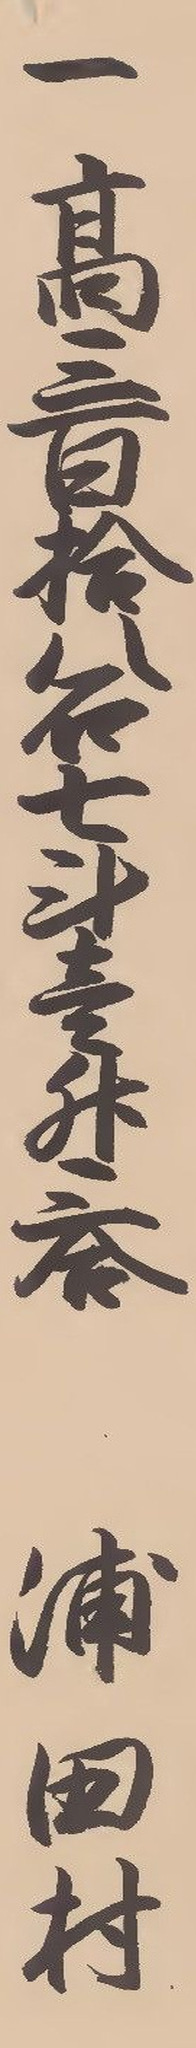一高三百拾八石七斗壱升三合浦田村
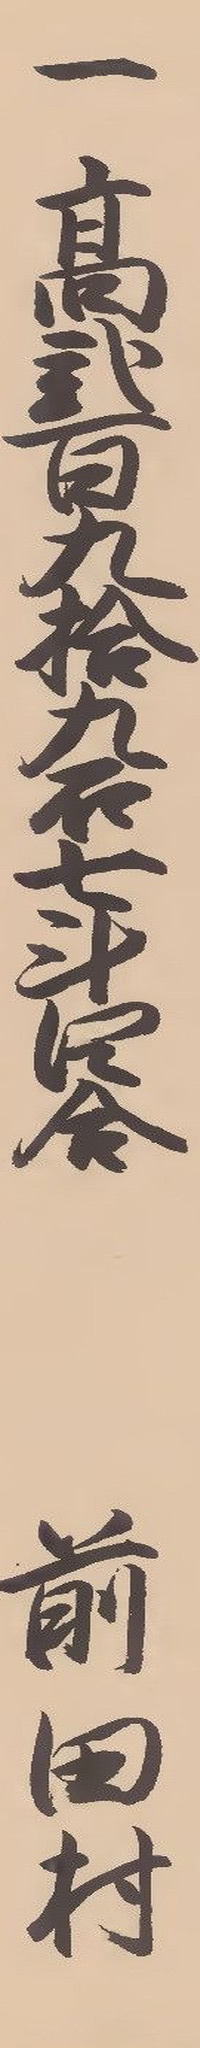一高弐百九拾九石七斗四合前田村
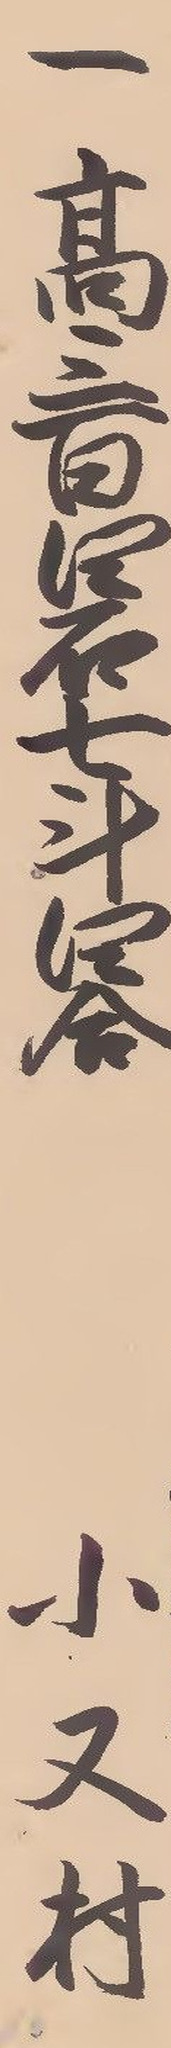一高三百四石七斗四合小又村

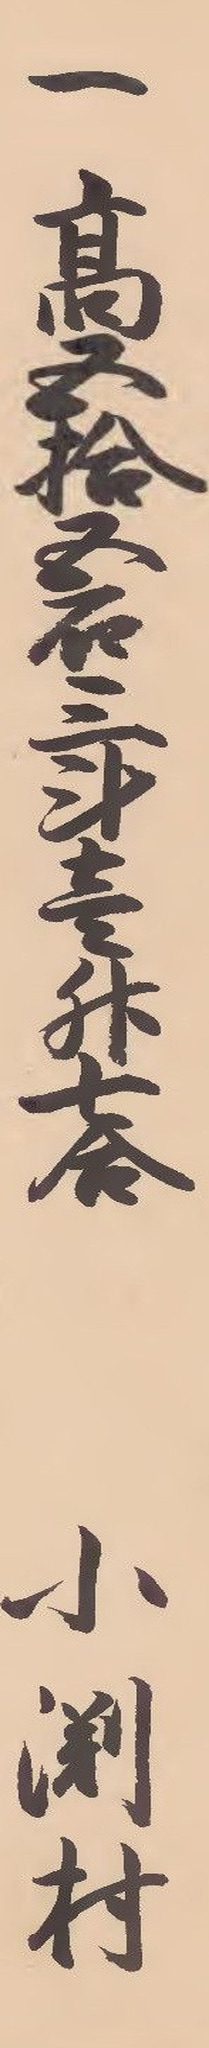一高五拾五石三斗壱升七合小淵村
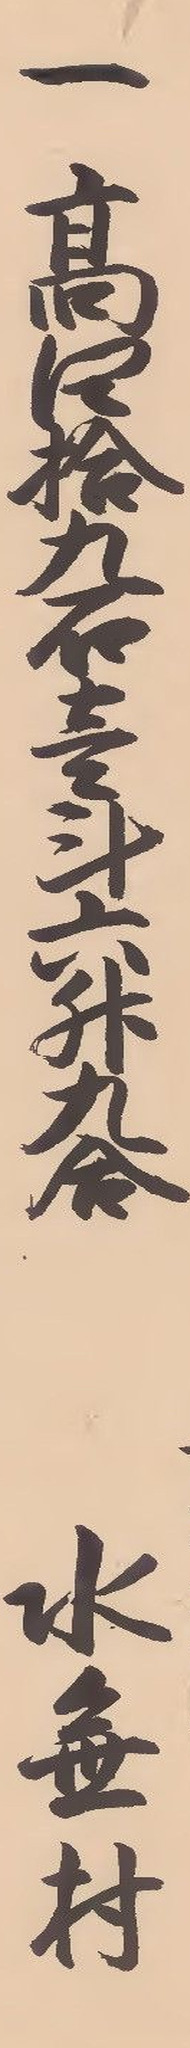一高四拾九石壱斗六升九合水無村
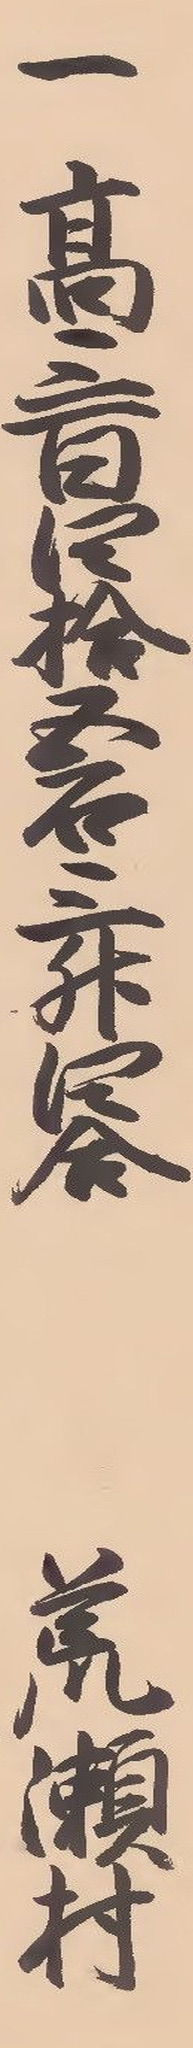一高三百四拾五石三升四合荒瀬村
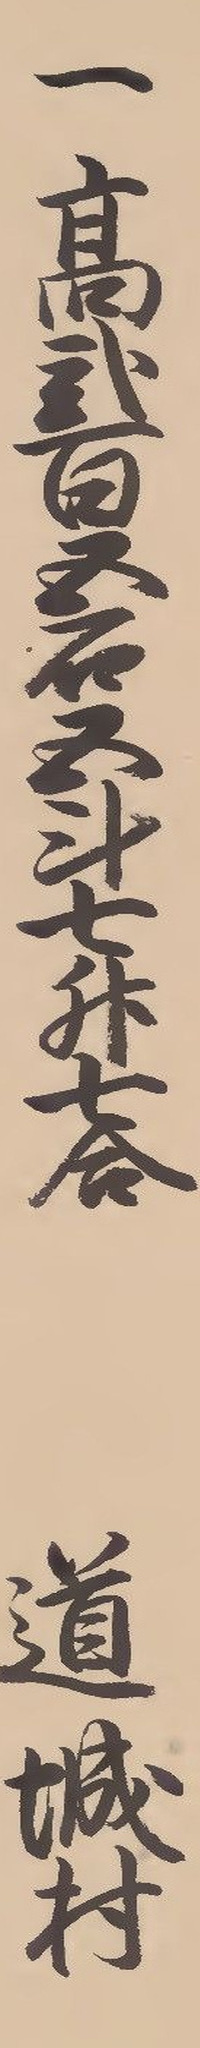一高弐百五石五斗七升七合道城村
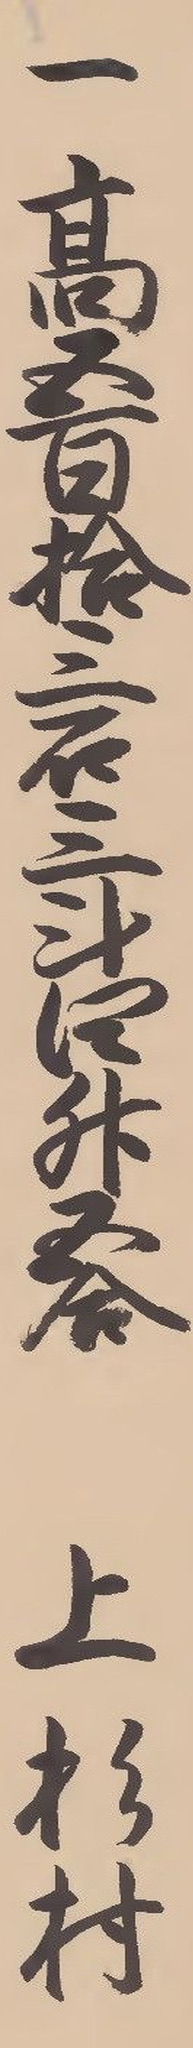一高五百拾三石三斗四升五合上杉村
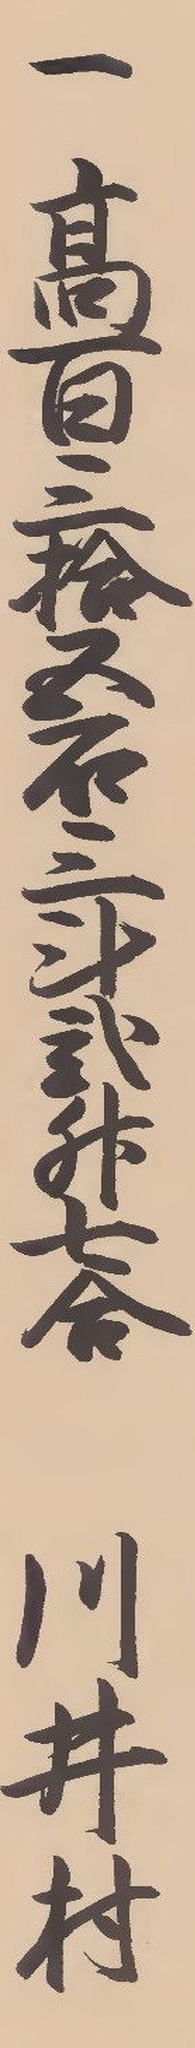一高百三拾五石三斗弐升七合川井村
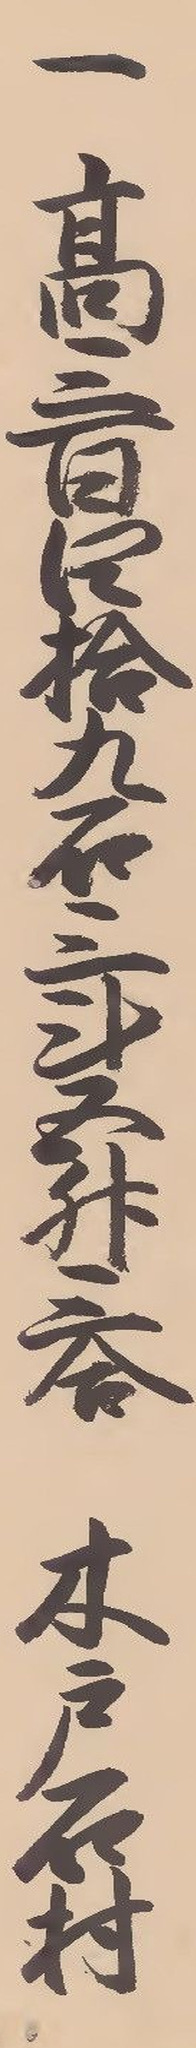一高三百四拾九石三斗五升三合木戸石村
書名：出羽国郷帳　５
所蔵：国立公文書館 National Archives of Japan
